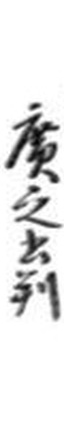広之書判
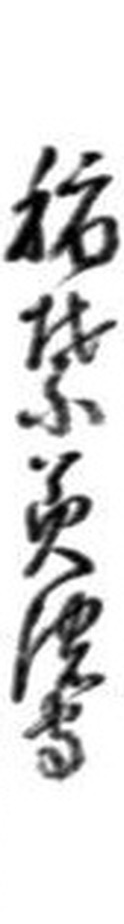稲葉美濃守
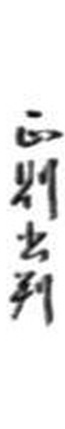正則書判
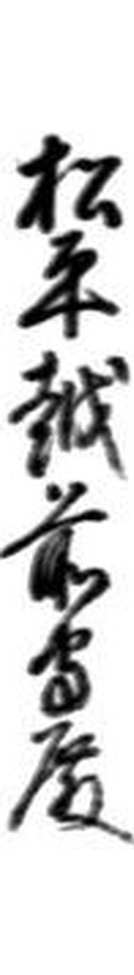松平越前守殿

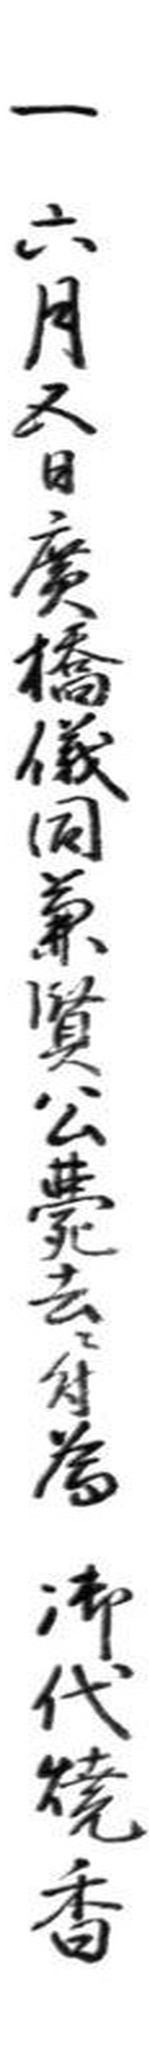一六月五日広橋儀同兼賢公薨去ニ付為御代焼香
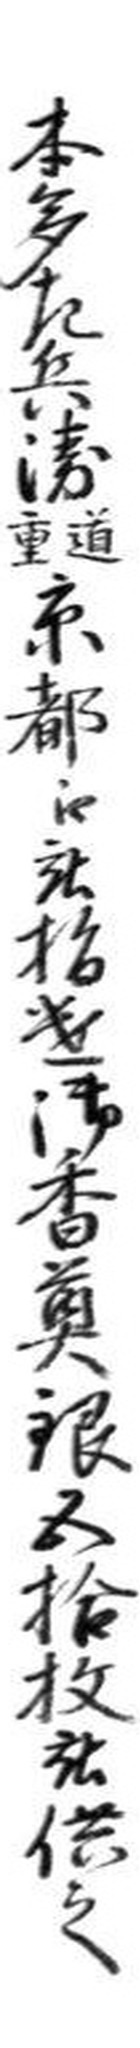本多左兵衛道重京都江被指遣御香奠銀五拾枚被供之
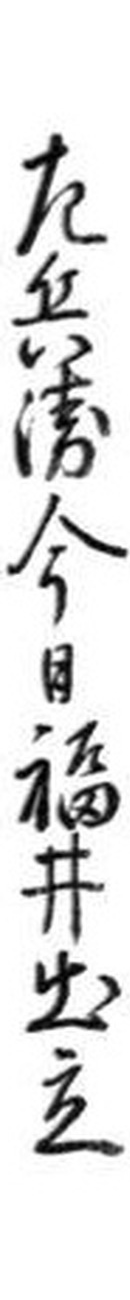左兵衛今日福井出立
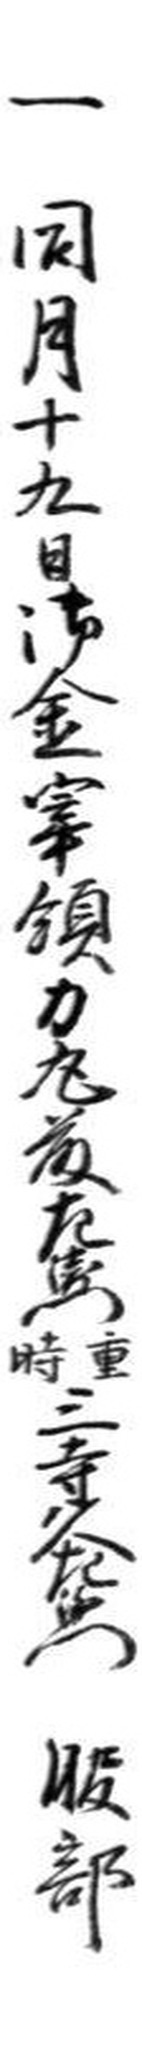一同月十九日御金宰領力丸藤左衛門重時三寺久左衛門服部
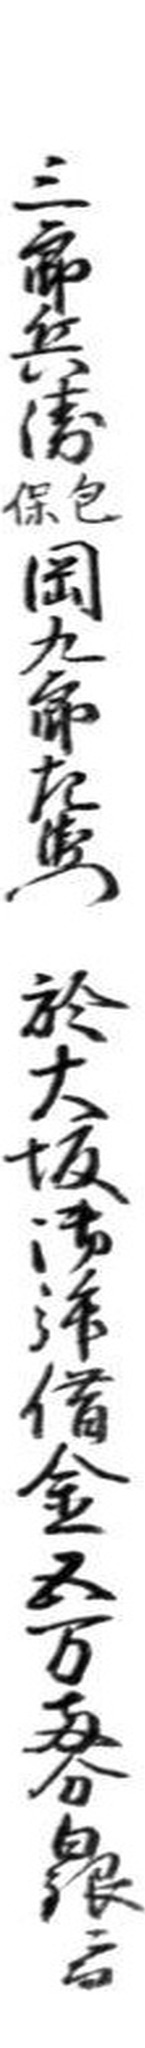三郎兵衛包保岡九郎左衛門於大坂御拝借金五万両分白銀二而
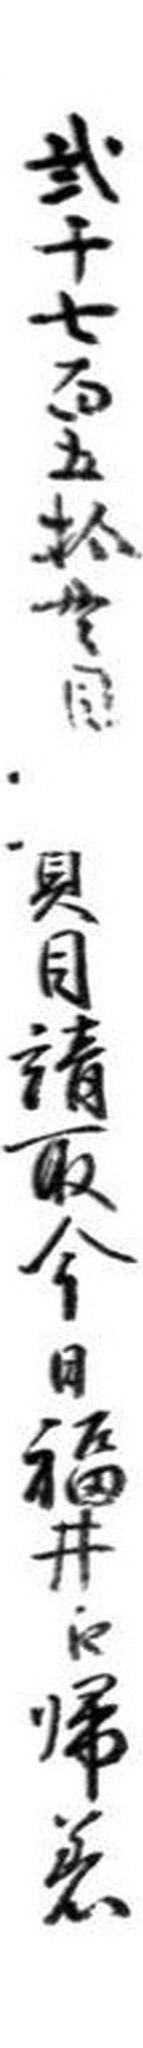弐千七百五拾貫目貫目請取今日福井江帰着
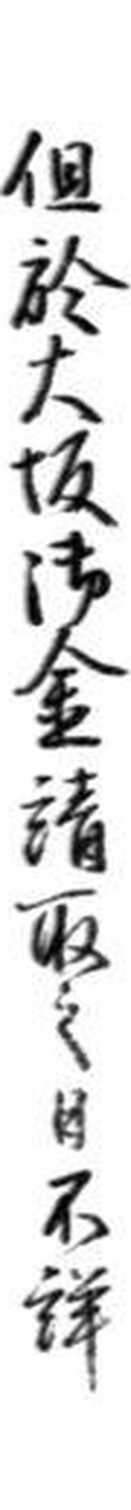但於大坂御金請取之日不詳
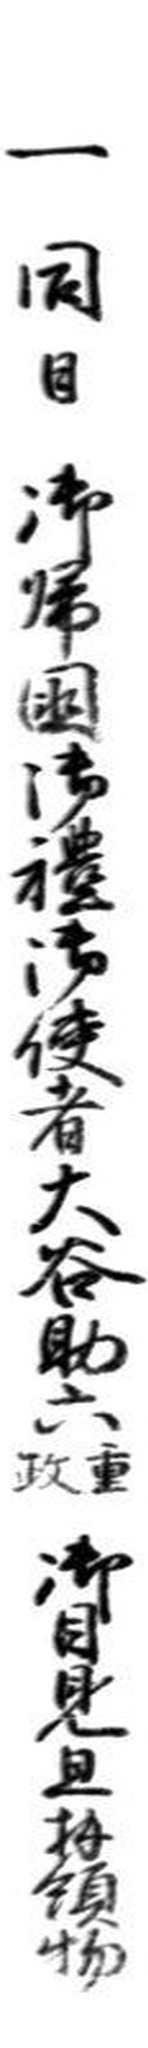一同日御帰国御礼御使者大谷助六重政御目見且拝領物
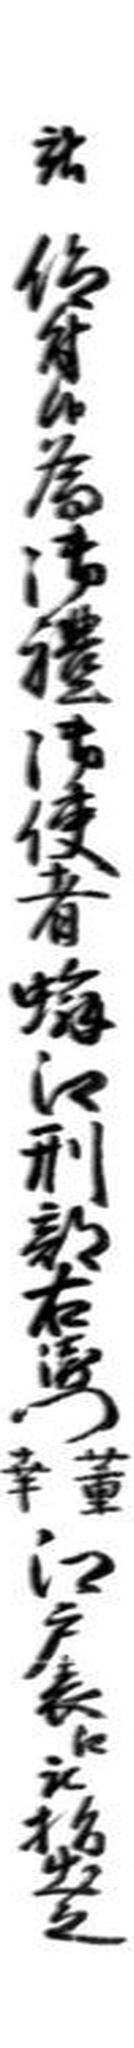被仰付候為御礼御使者蠏江刑部右衛門董幸江戸表江被指出之
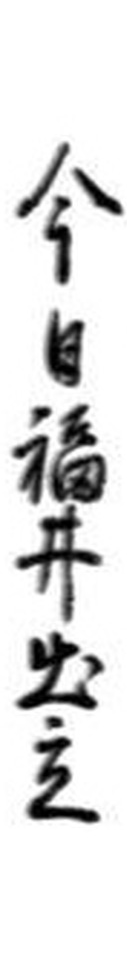今日福井出立
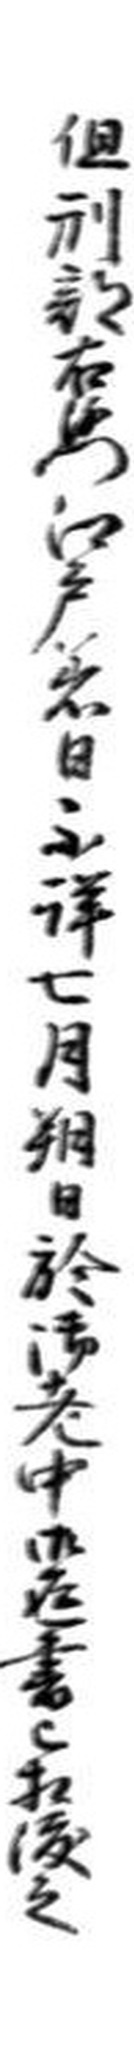但刑部右衛門江戸着日不詳七月朔日於御老中御返書被相渡之
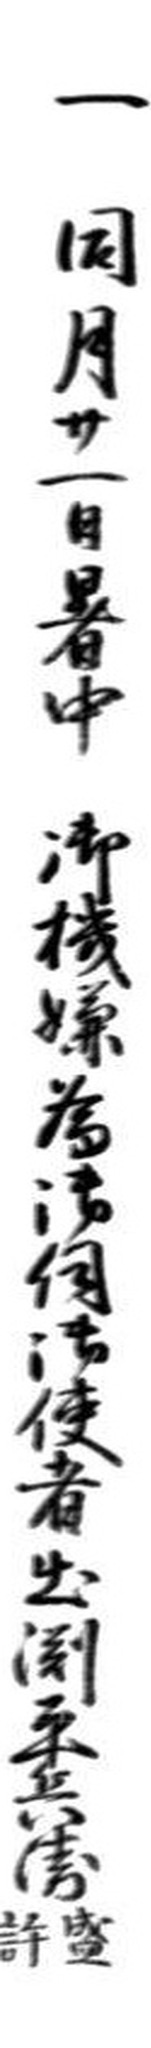一同月廿一日暑中御機嫌為御伺御使者出渕平兵衛盛許
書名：家譜 七 光通公 従寛文四年到同九年
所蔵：福井県文書館 Fukui Prefectural Archives
